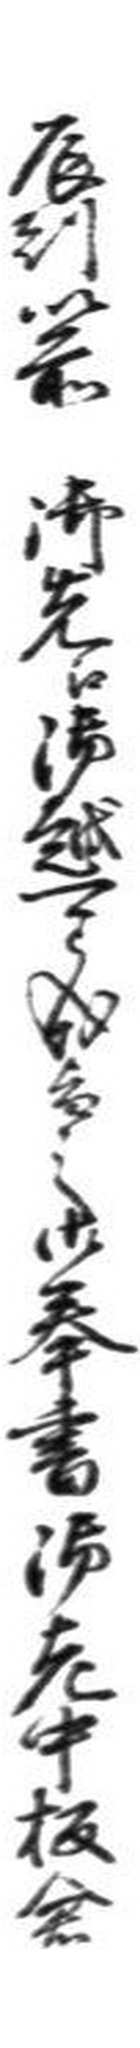辰刻以前御先江御越可被成旨之御奉書御老中板倉
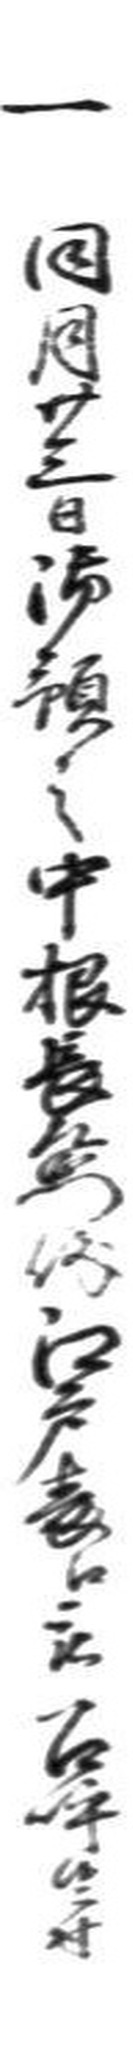一同月廿三日御預之中根長左衛門儀江戸表江被召呼候ニ付
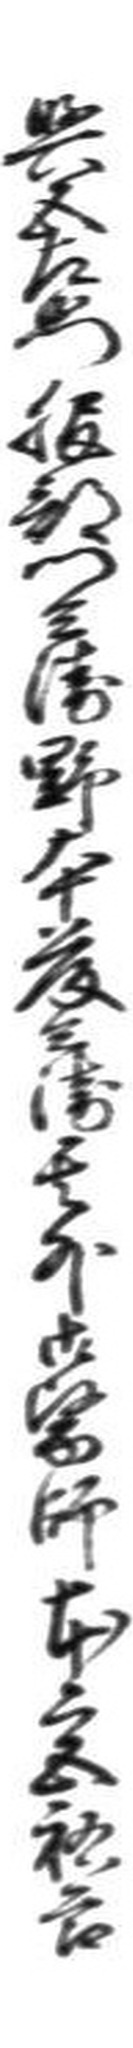与五左衛門服部門兵衛野本藤兵衛其外御医師本宮祐節
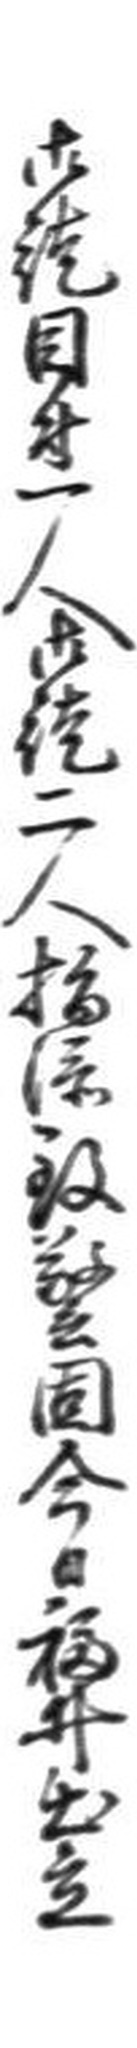御徒目付一人御徒二人指添致警固今日福井出立
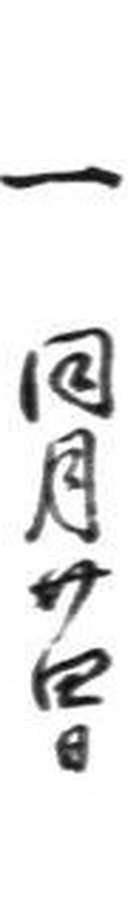一同月廿四日
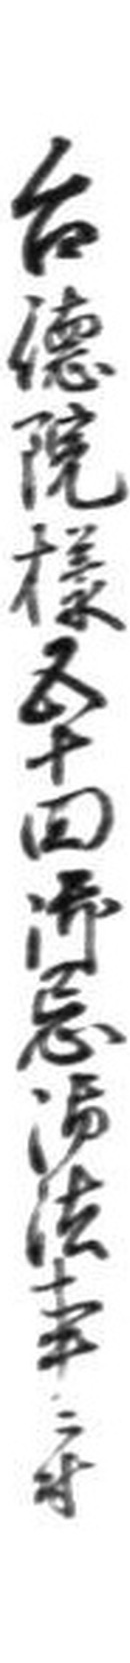台徳院様五十回御忌御法事ニ付

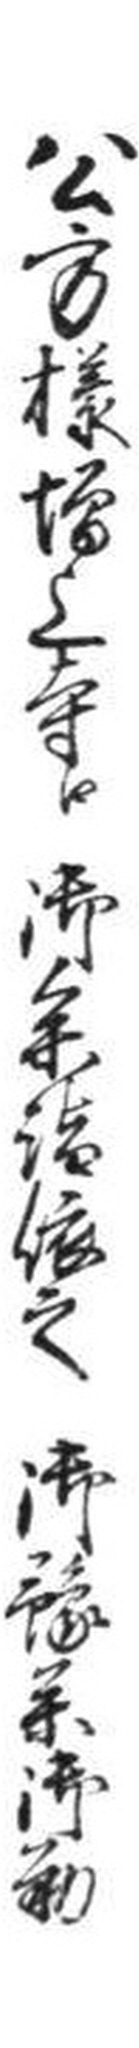公方様増上寺江御参詣依之御予参御勤
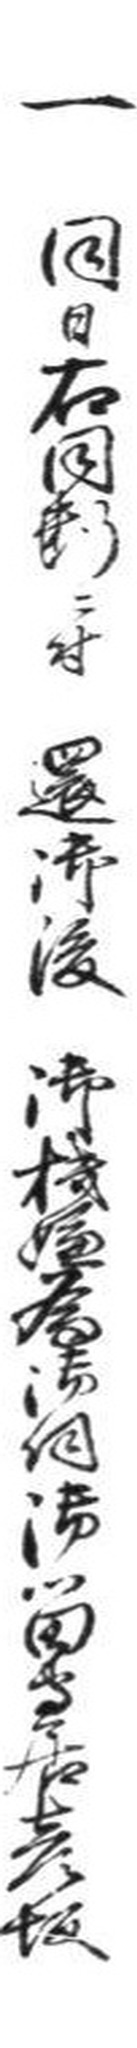一同日右同断ニ付還御後御機嫌為御伺御留守居彦坂
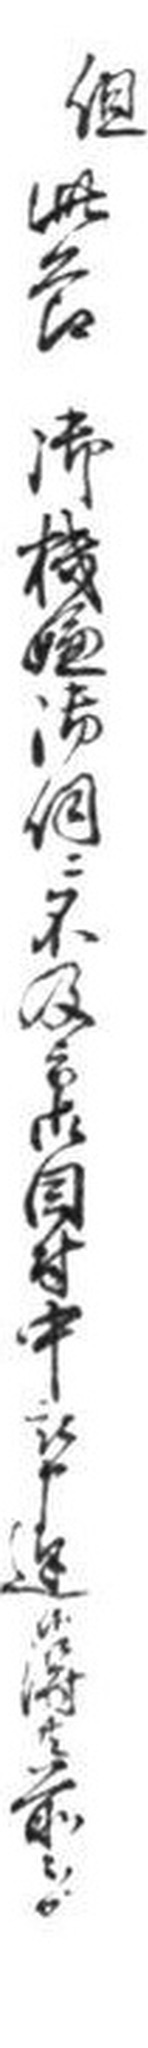但此節御機嫌御伺ニ不及旨御目付中被申達候得共前々ゟ
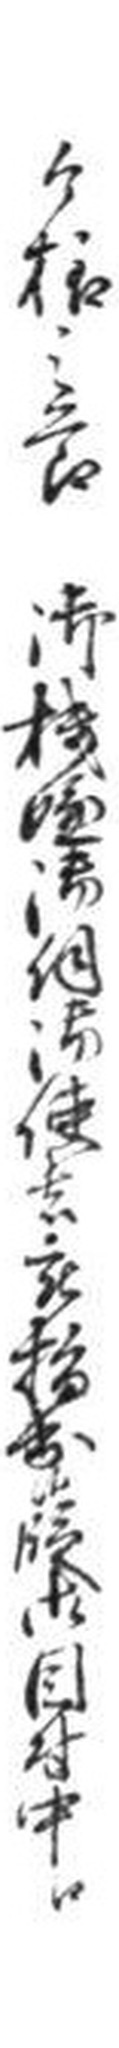ヶ様之節御機嫌御伺御使者被指出候段御目付中江
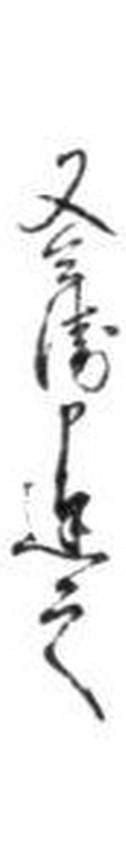又兵衛申達之
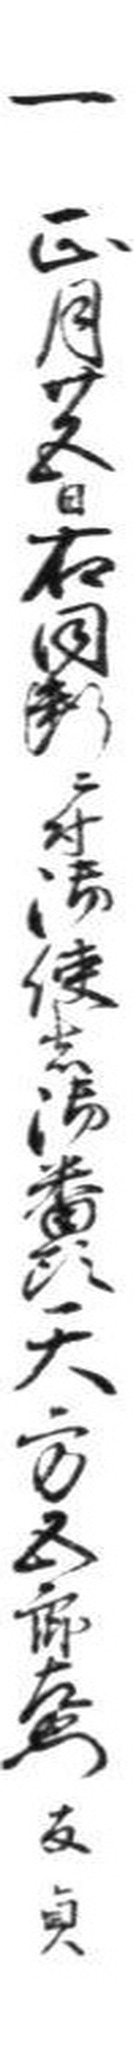一正月廿五日右同断ニ付御使者御番頭天方五郎左衛門友貞
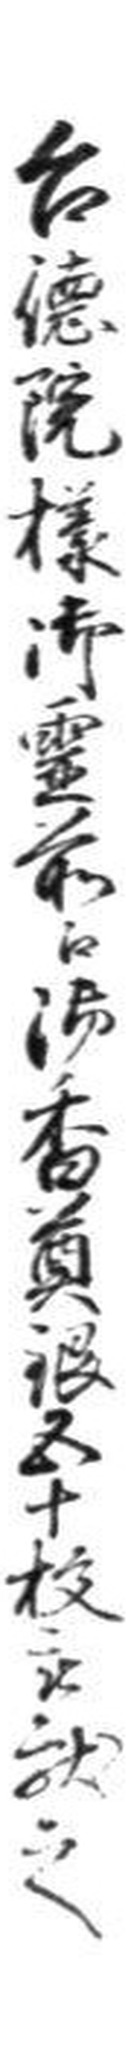台徳院様御霊前江御香奠銀五十枚被献之
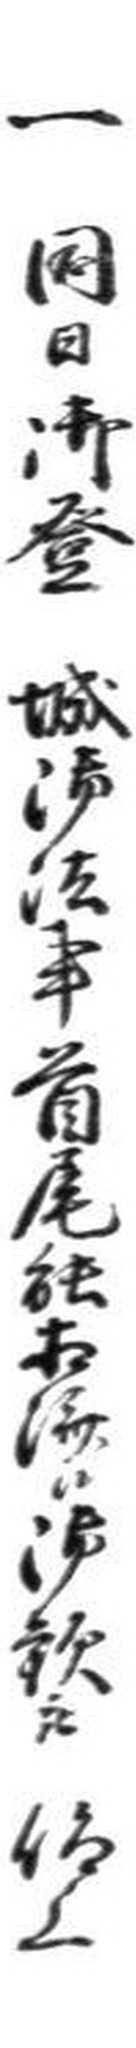一同日御登城御法事首尾能相済候御歓被仰上
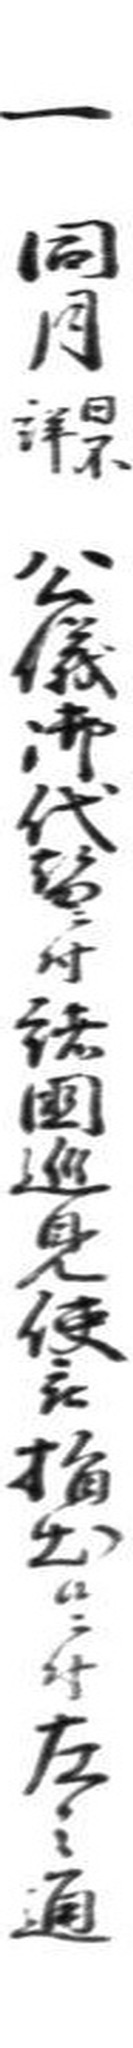一同月日不詳公儀御代替ニ付諸国巡見使被指出候ニ付左之通
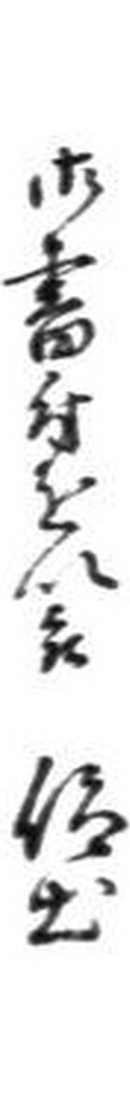御書付を以被仰出
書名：家譜 十五 綱昌公 従天和元年到元禄十二年
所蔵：福井県文書館 Fukui Prefectural Archives
